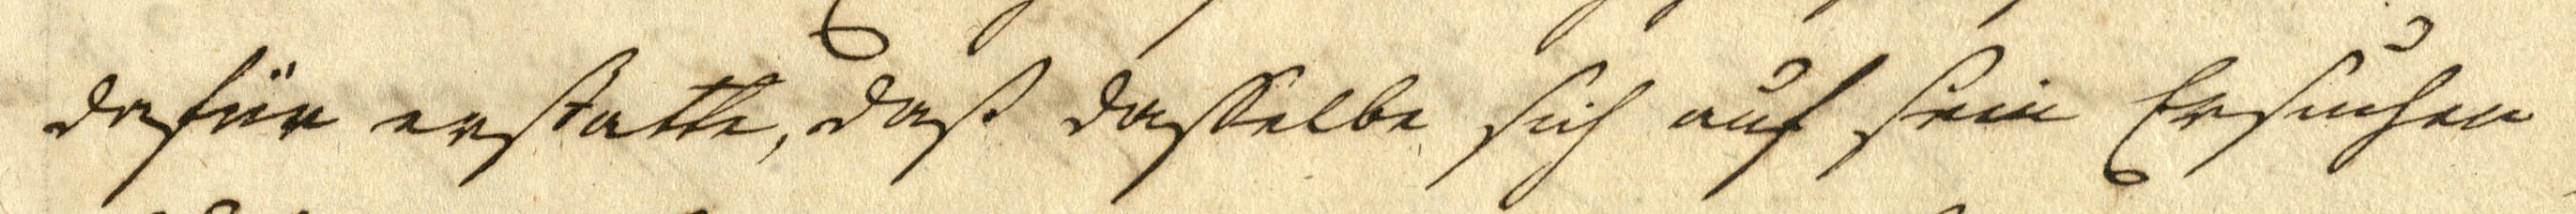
dafür erstatte, daß dasselbe sich auf sein Ersuchen
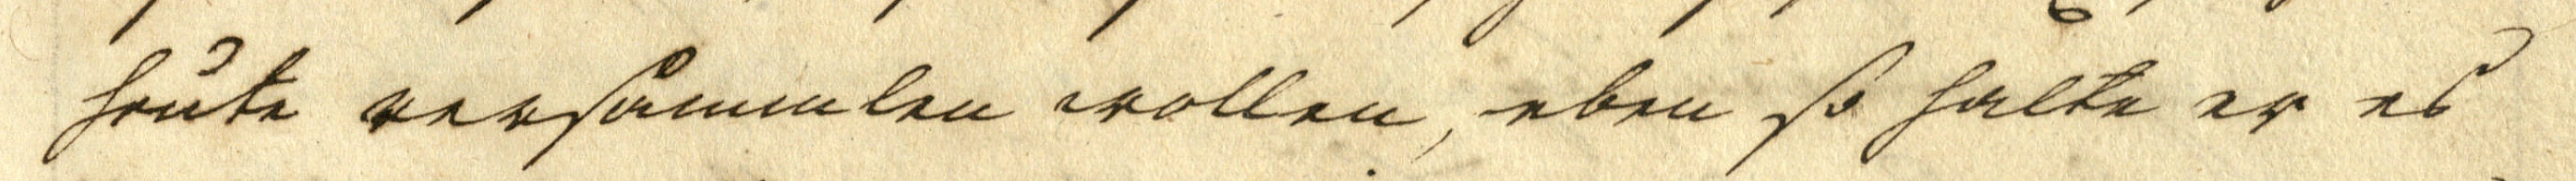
heute versammlen wollen, eben so halte er es
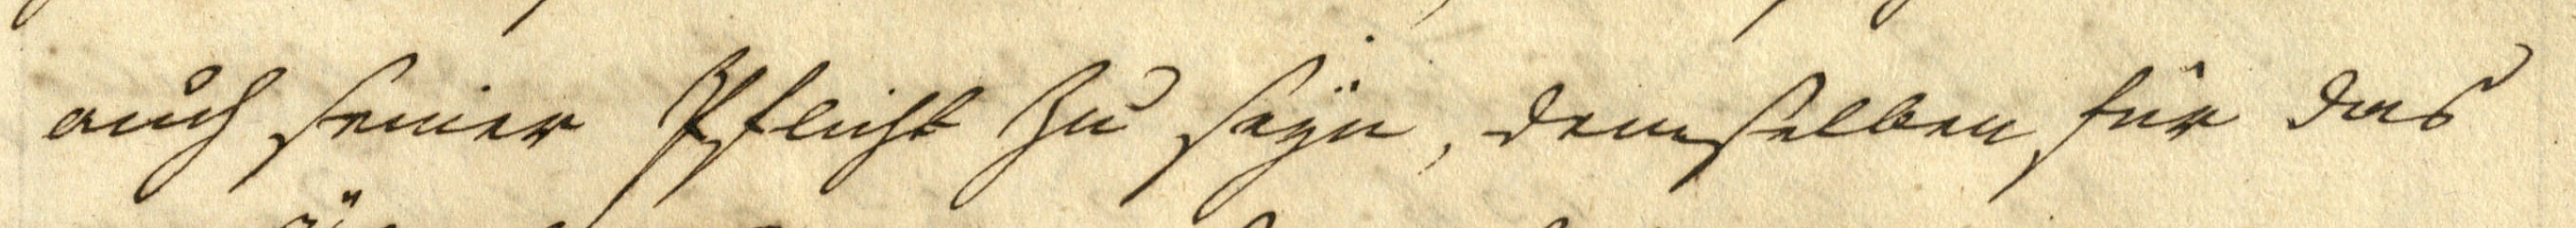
auch seiner Pflicht zu seyn, demselben für das
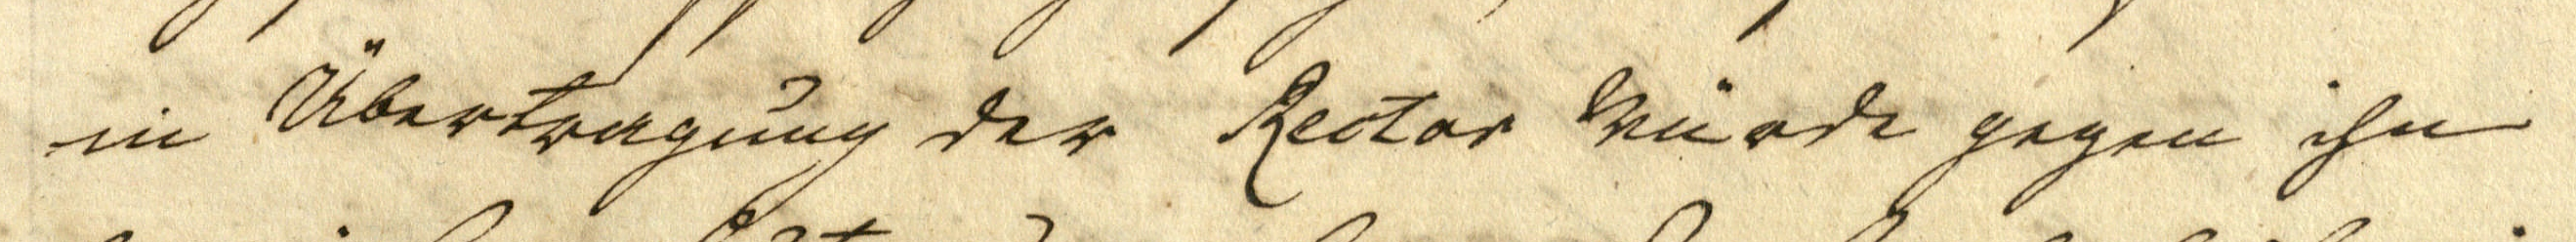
in Übertragung der Rector Würde gegen ihn
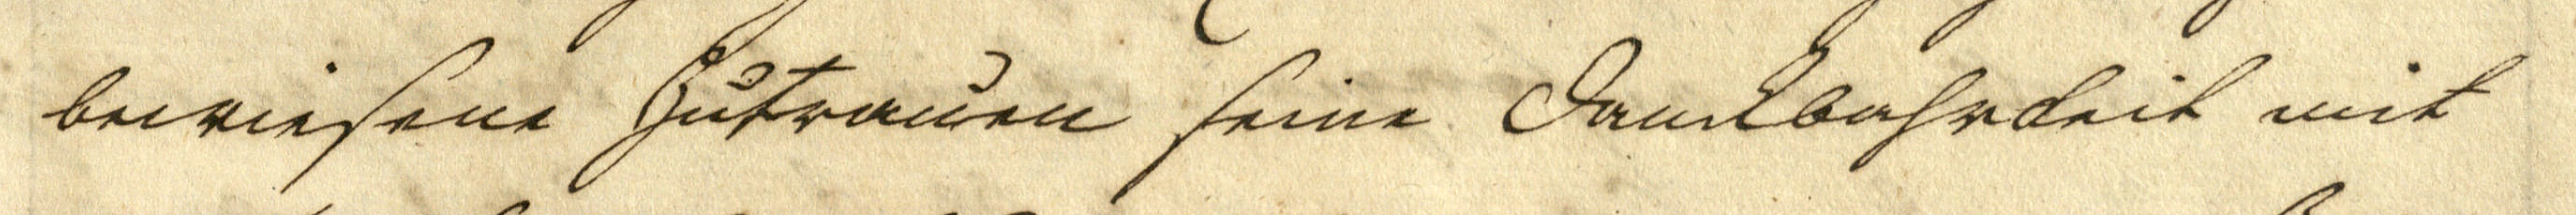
bewiesene Zutrauen seine Dankbarkeit mit
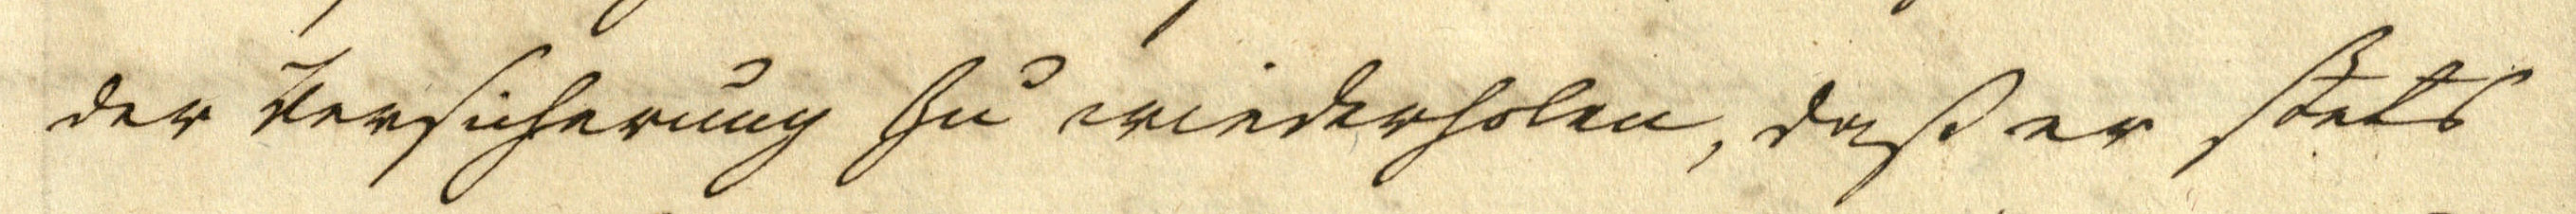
der Versicherung zu wiederholen, daß er stets
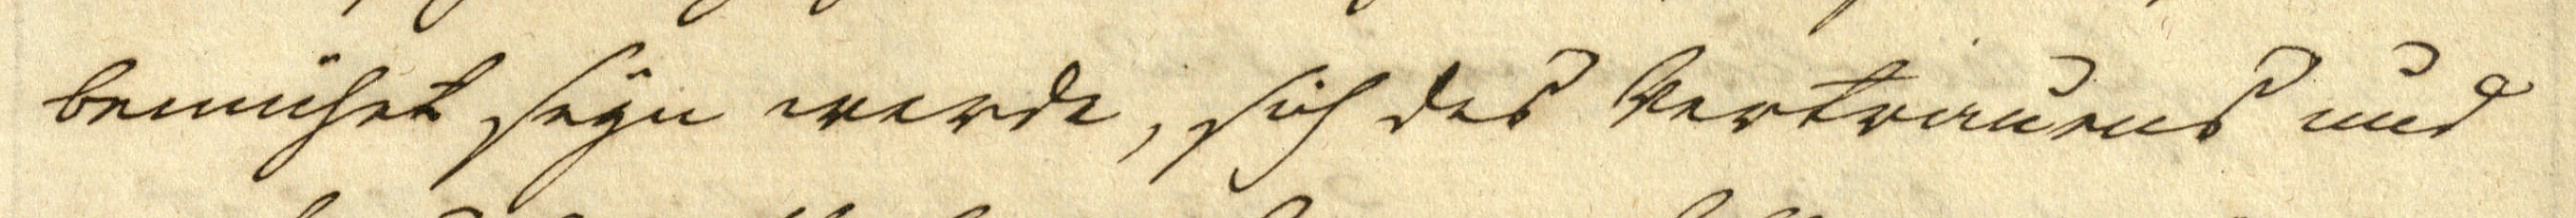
bemühet seyn werde, sich des Vertrauens und
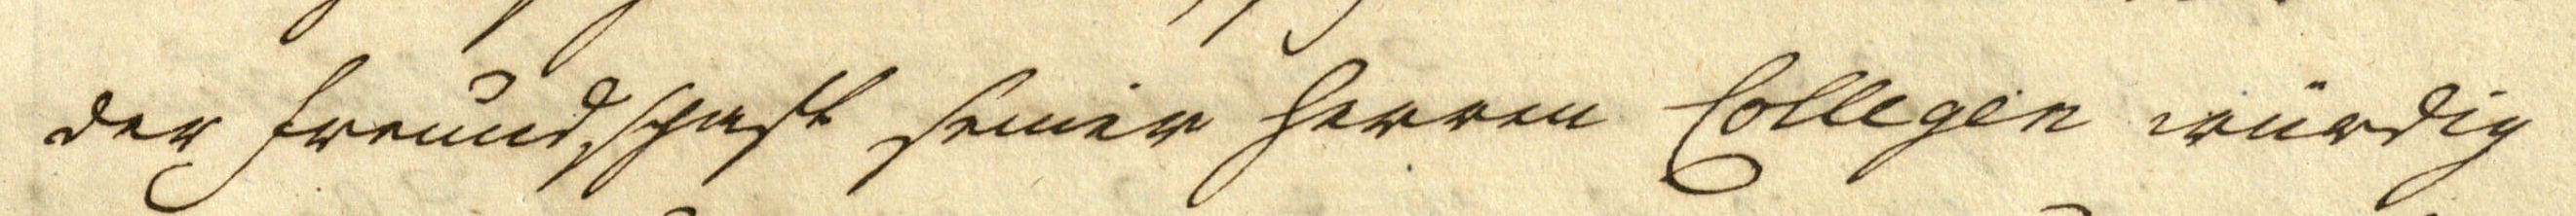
der Freundschaft seiner Herren Collegen würdig
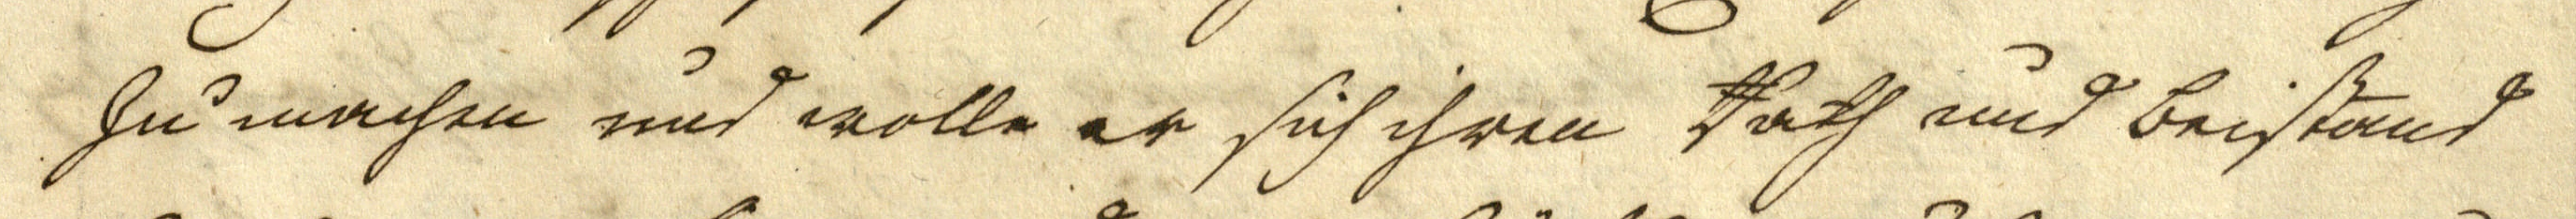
zu machen und wolle er sich ihren Rath und Beistand
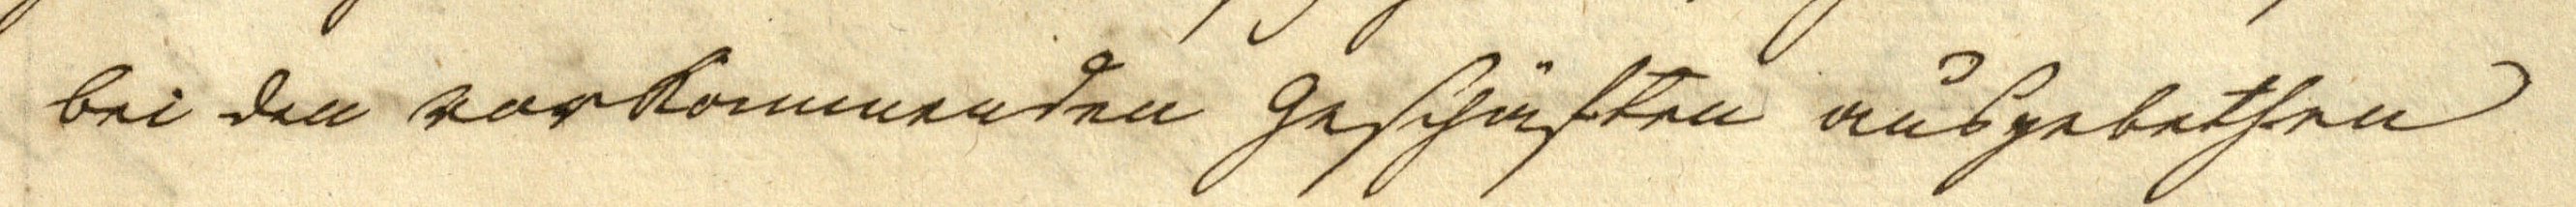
bei den vorkommenden Geschäften ausgebethen
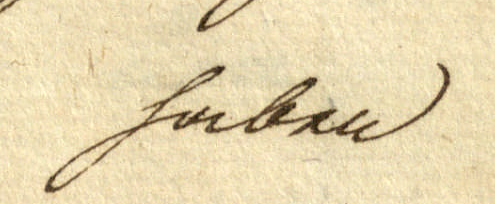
haben
